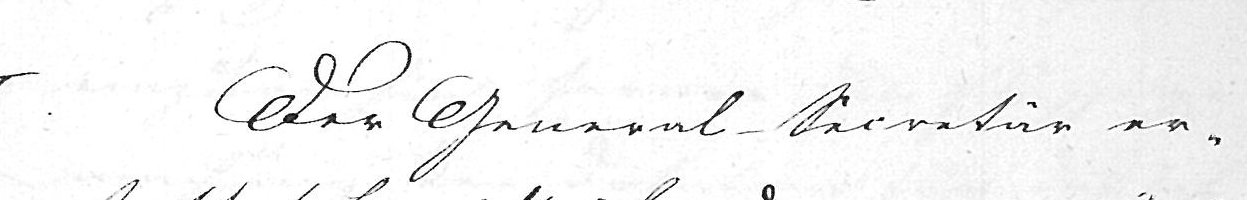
Der General-Secretär er
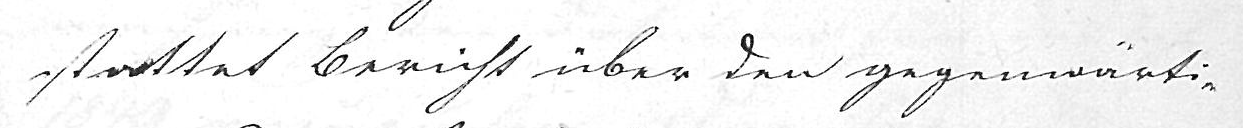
stattet Bericht über den gegenwärti-
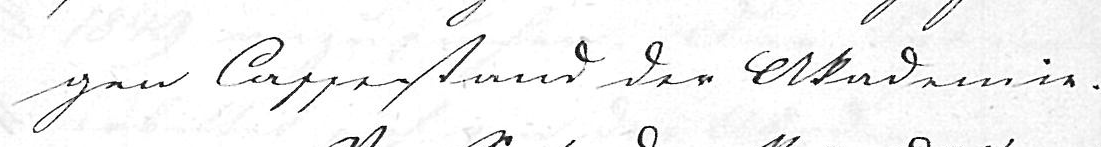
gen Cassestand der Akademie.
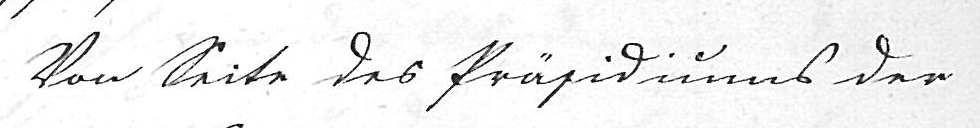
Von Seite des Präsidiums der
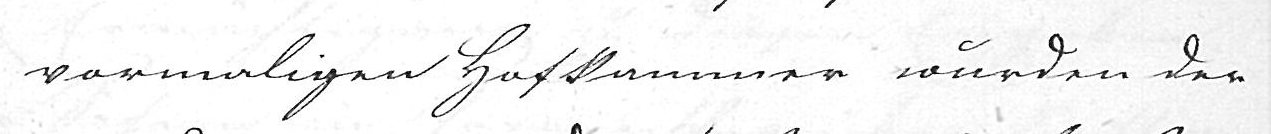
vormaligen Hofkammer wurden der
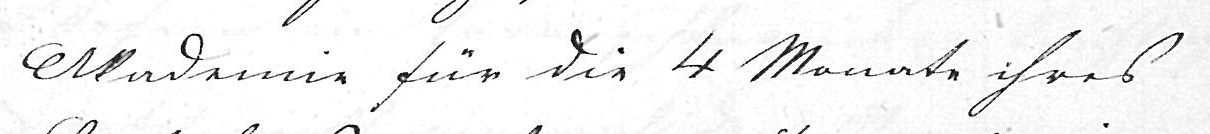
Akademie für die 4 Monates ihres
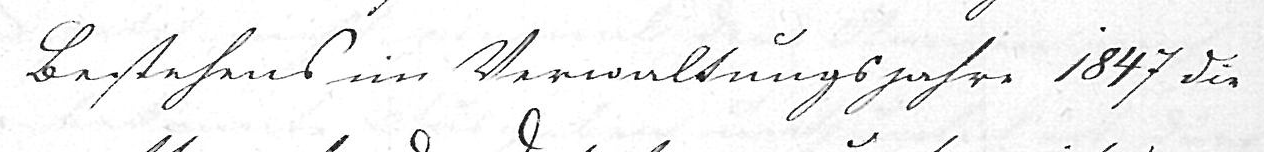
Bestehens im Verwaltungsjahr 1847 die
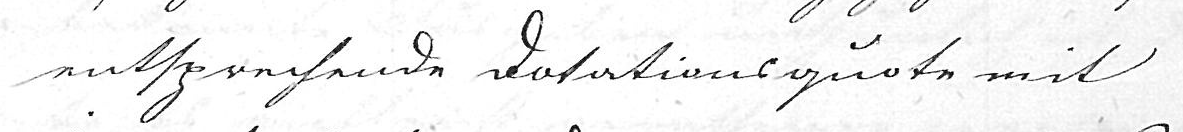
entsprechende Dotationsquote mit
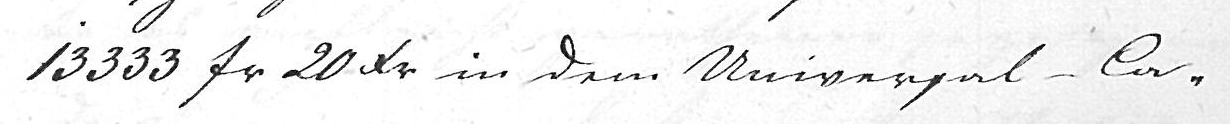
13333 fr 20 kr in dem Uuniversal Ca-
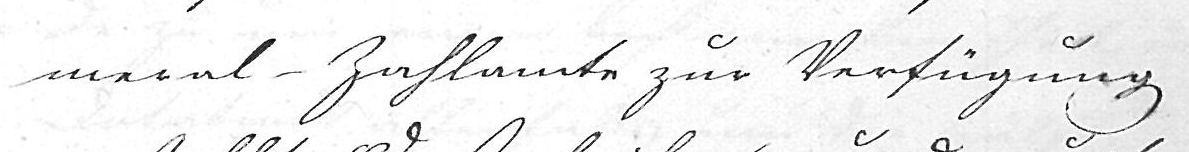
meral-Zahlamte zur Verfügung
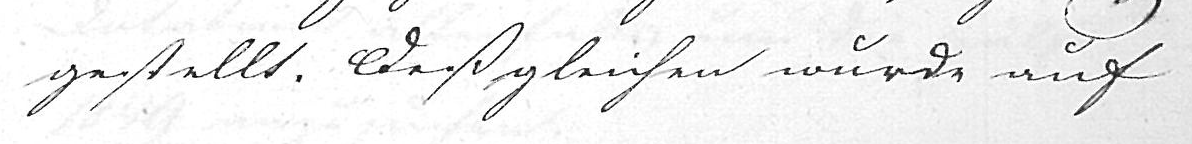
gestellt. Deßgleichen wurde auf
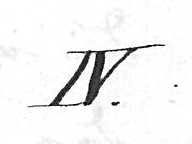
IV.
